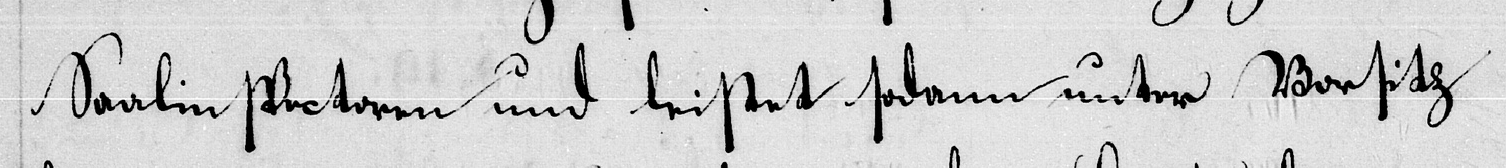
Saalinspectoren und leistet sodann unter Vorsitz
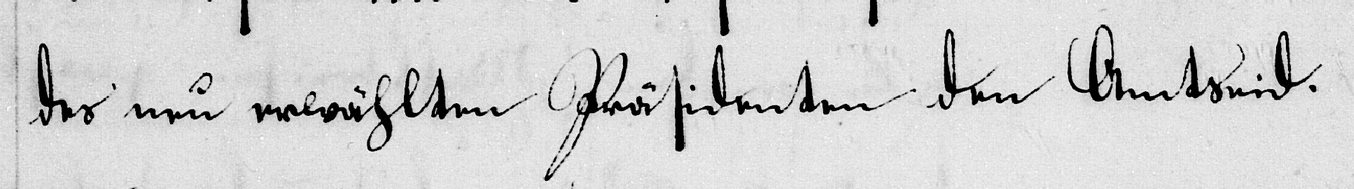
des neu erwählten Präsidenten den Amtseid.
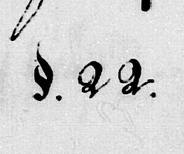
§.22.
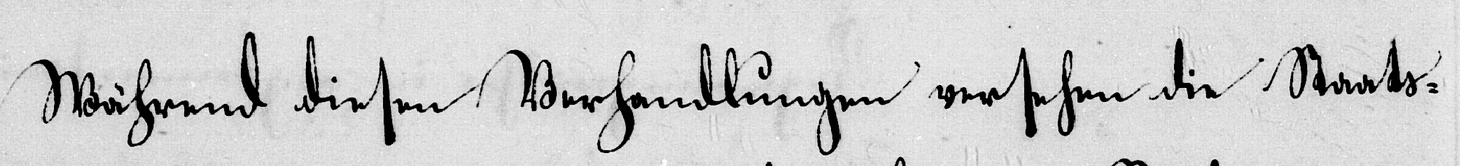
Während dieser Verhandlungen versehen die Staats¬
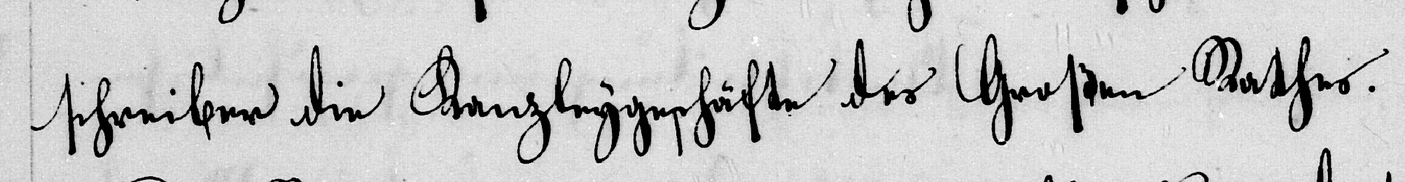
schreiber die Kanzleygeschäfte des Großen Rathes.
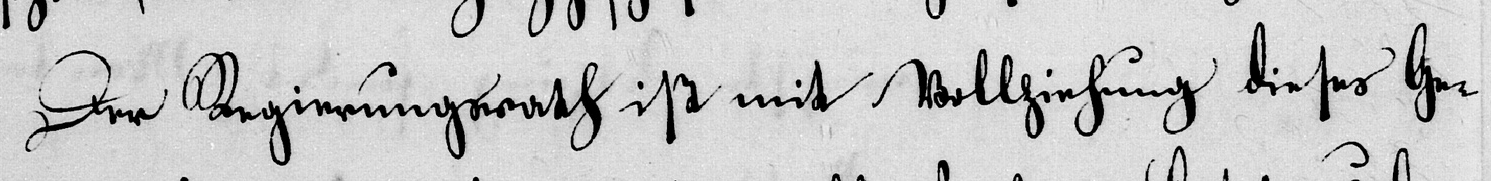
Der Regierungsrath ist mit Vollziehung dieses Ge¬
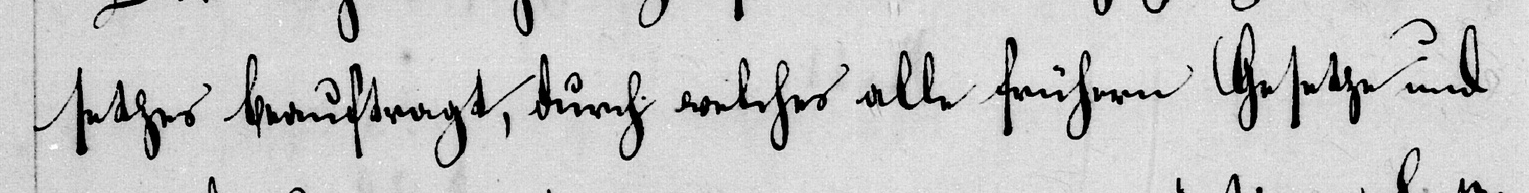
setzes beauftragt, durch welches alle frühern Gesetze und
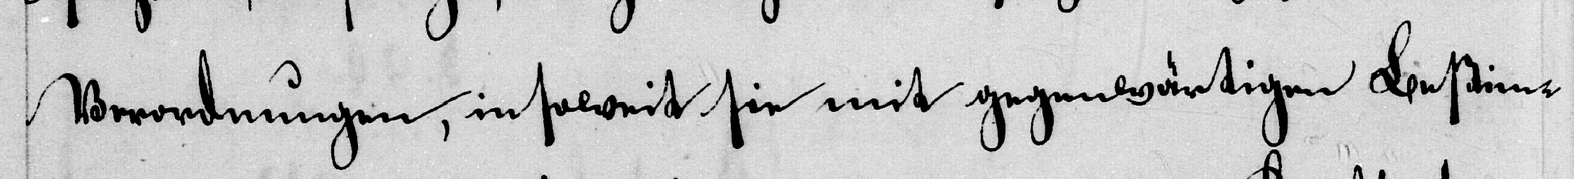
Verordnungen, insoweit sie mit gegenwärtigen Bestim¬
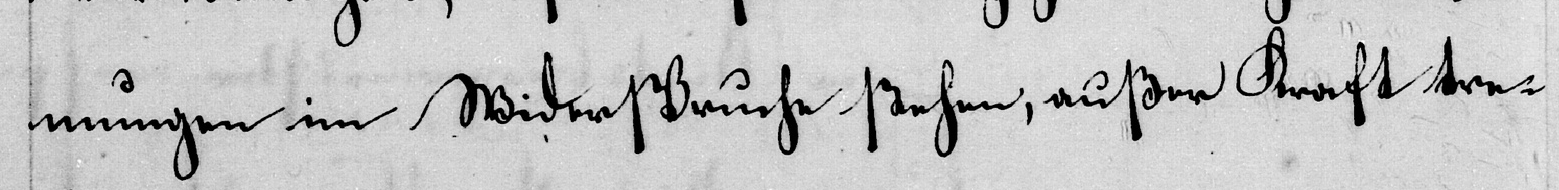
mungen im Widerspruche stehen, außer Kraft tre¬
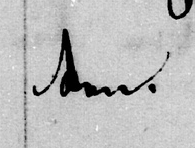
ten.
